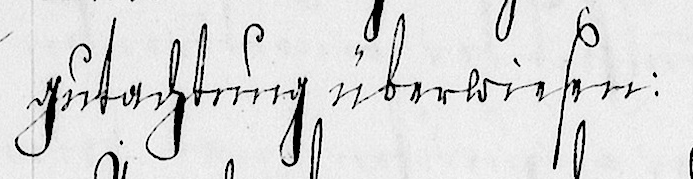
gutachtung überwiesen:
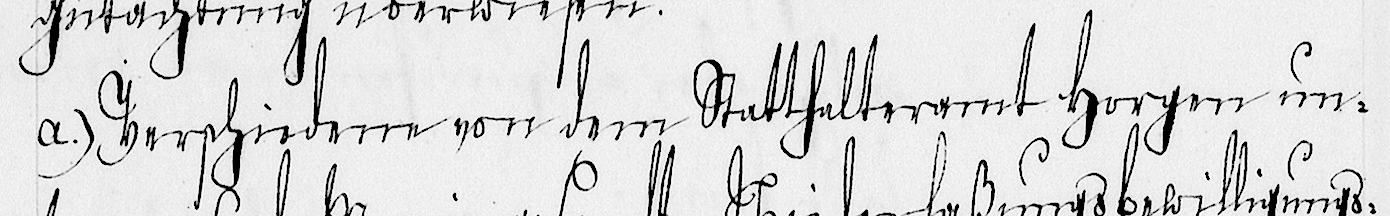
a.) Verschiedene von dem Statthalteramt Horgen un¬
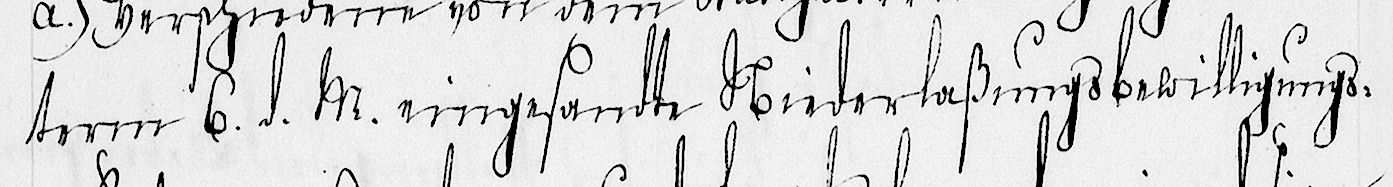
term 6. d. M. eingesandte Niederlaßungsbewilligungs¬
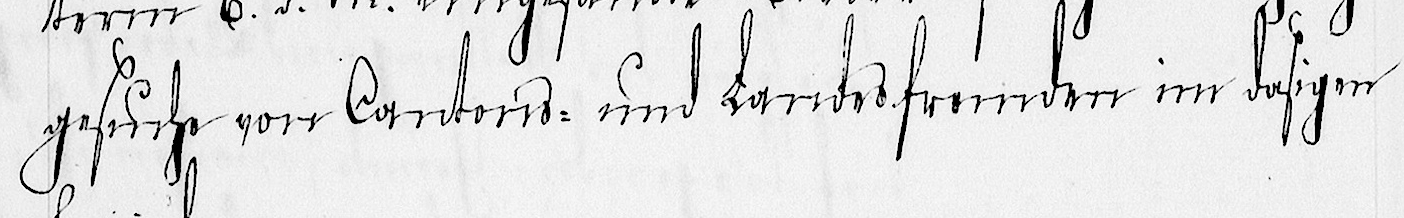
gesuche von Cantons- und Landesfremden im dasigen
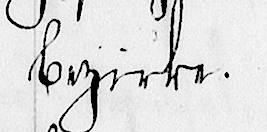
Bezirke.
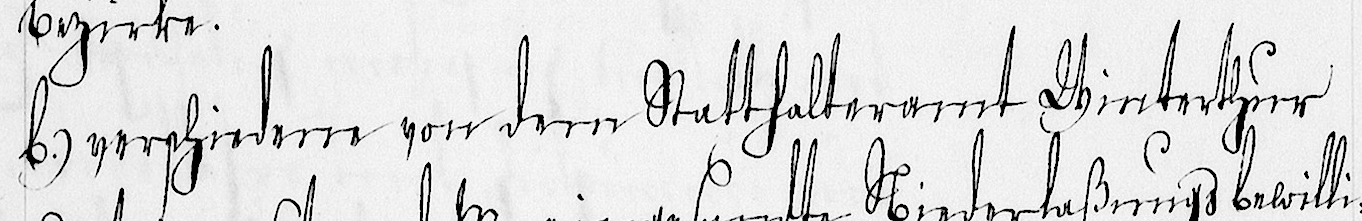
verschiedene von dem Statthalteramt Winterthur
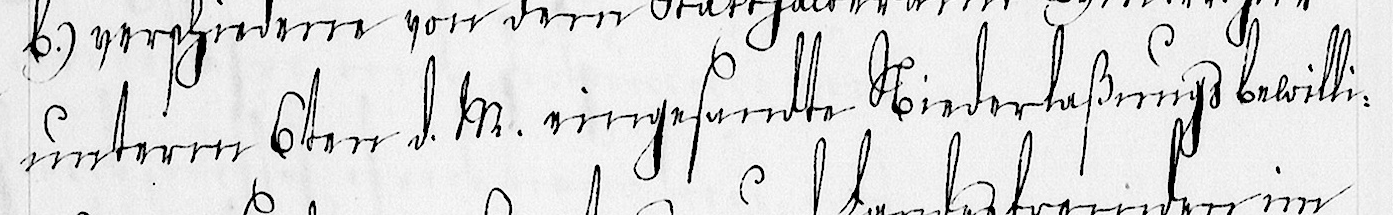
unterm 6ten d. M. eingesandte Niederlaßungsbewilli¬
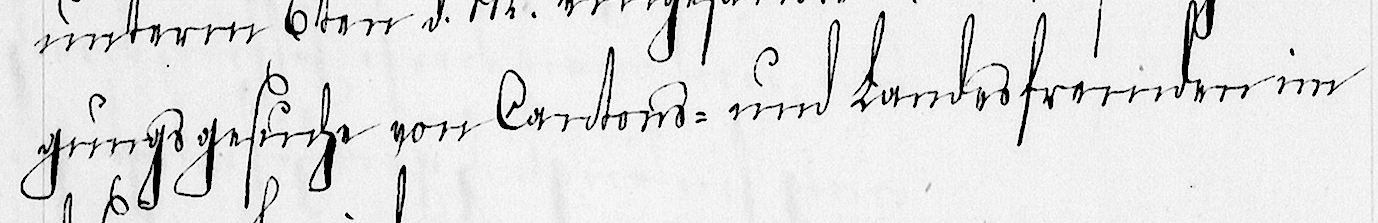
gungsgesuche von Cantons- und Landesfremden im
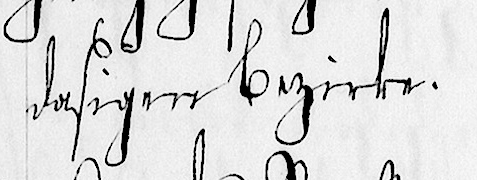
dasigen Bezirke.
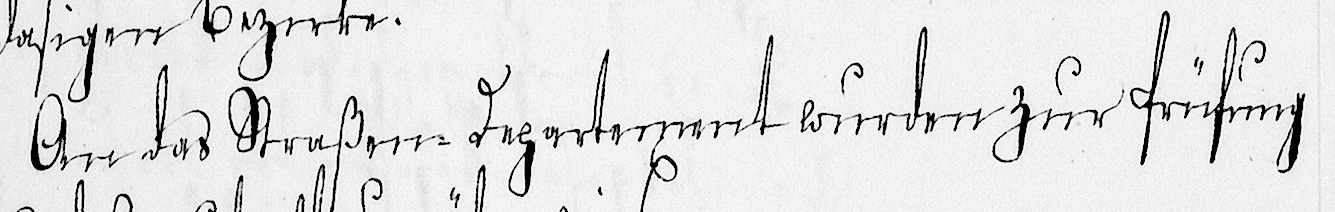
An das Straßen-Departement wurden zur Prüfung
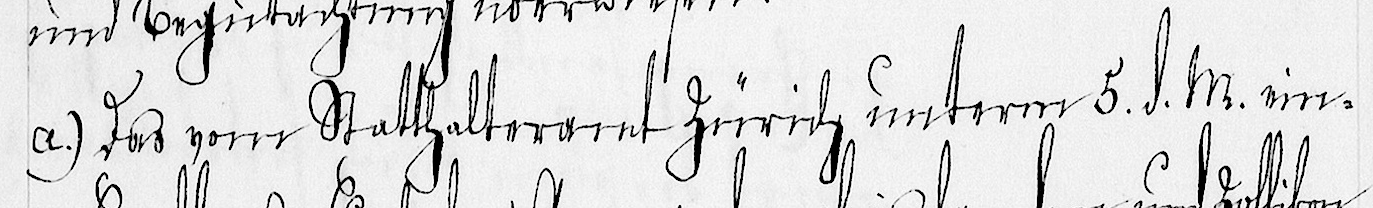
a.) Das vom Statthalteramt Zürich unterm 5. d. M. ein¬
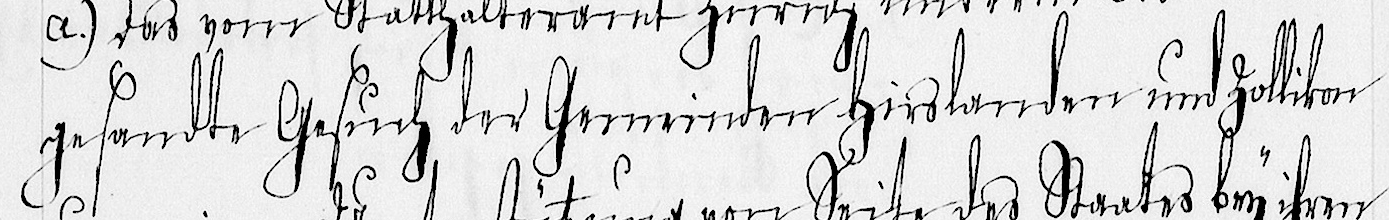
gesandte Gesuch der Gemeinden Hirslanden und Zolli¬
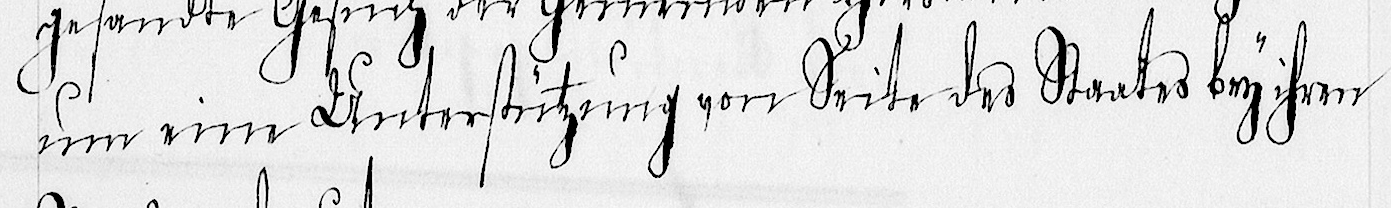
um eine Unterstützung von Seite des Staates bey ihren
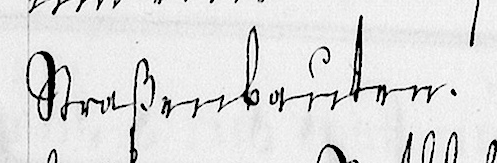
Straßenbauten.
